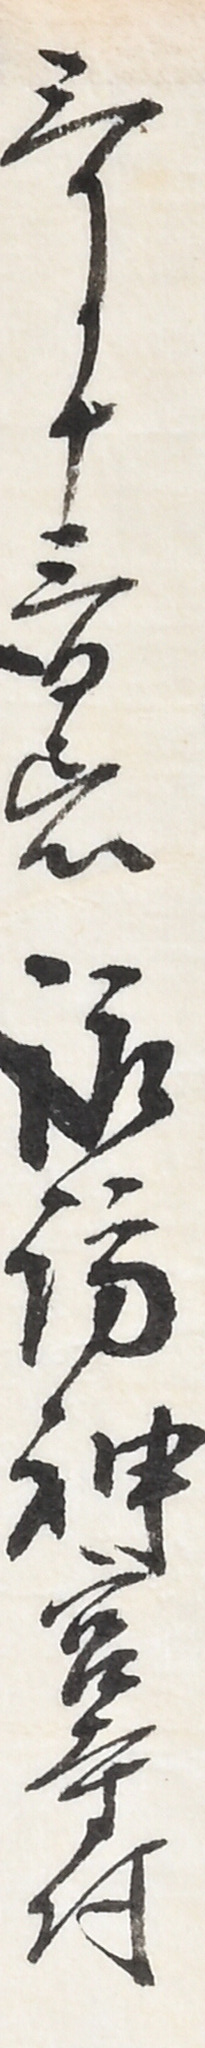三月十三日着諏訪神宮寺付
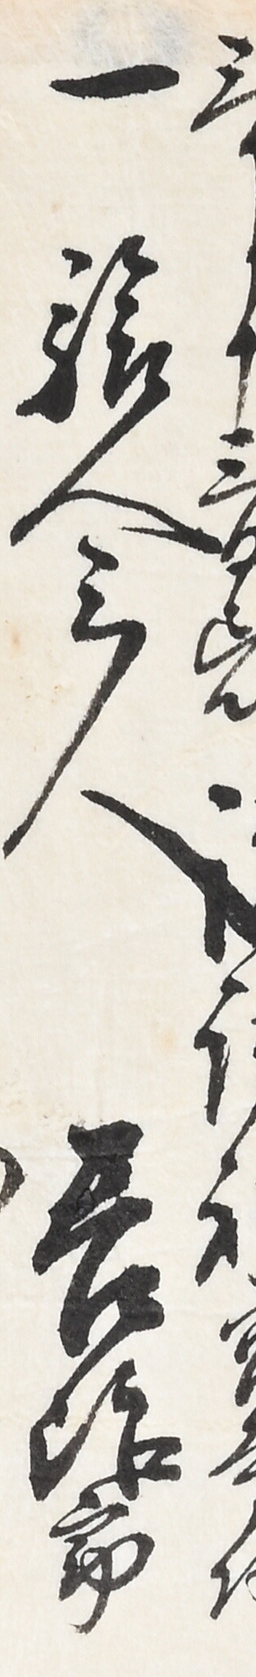一旅人三人善治郎
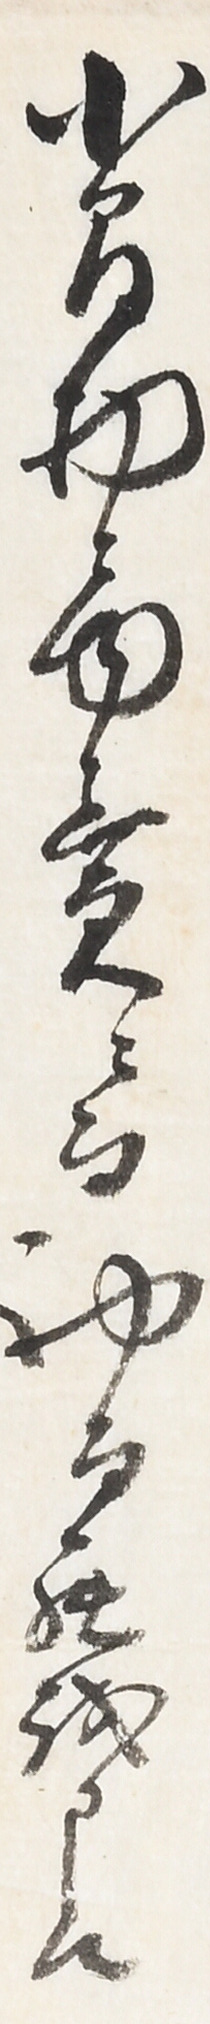小間物商売ニ而初而罷越申候
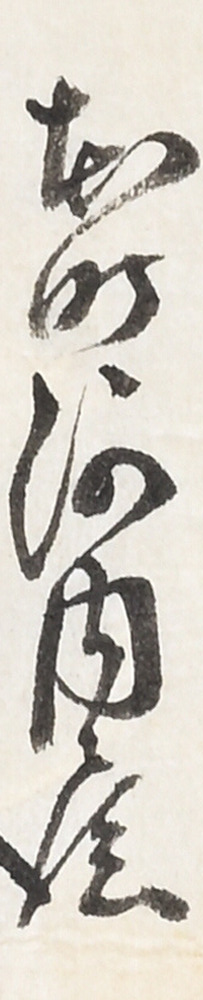本町河内屋
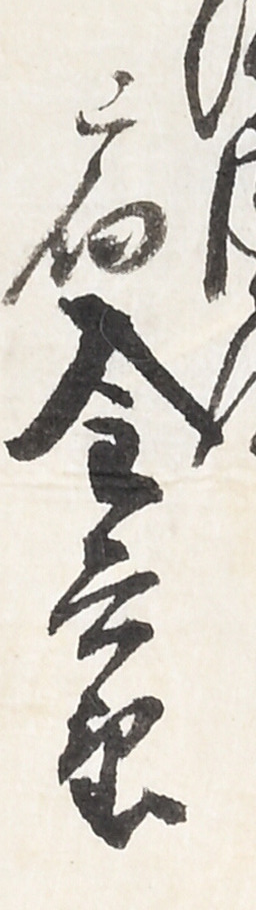宿金兵衛
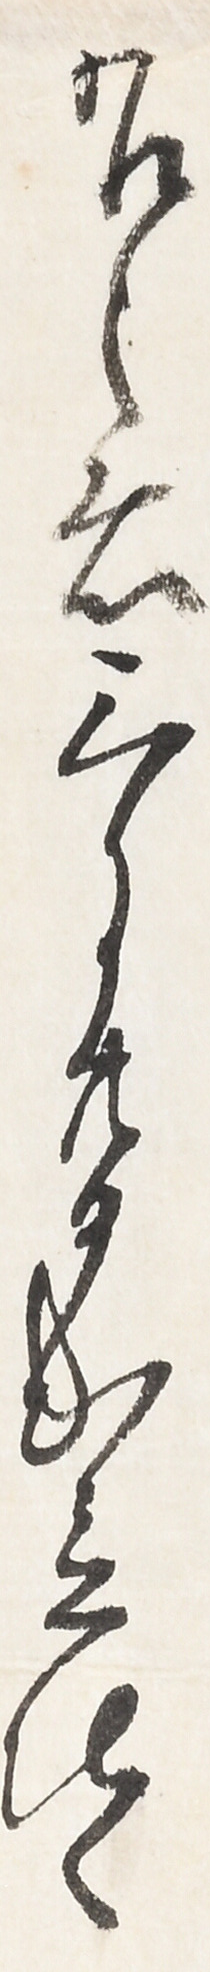右之者三月廿日出立仕候
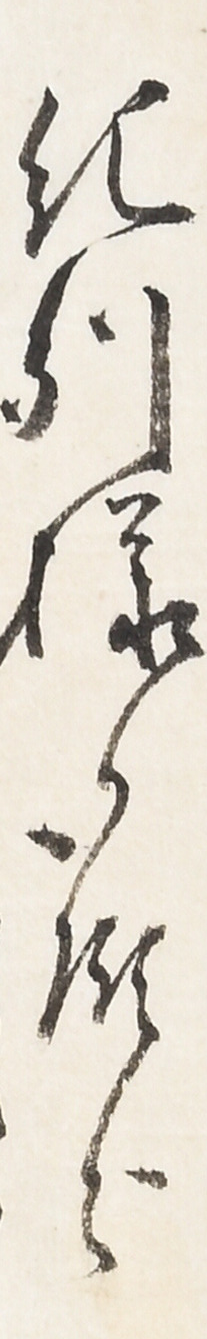紀州様御領分
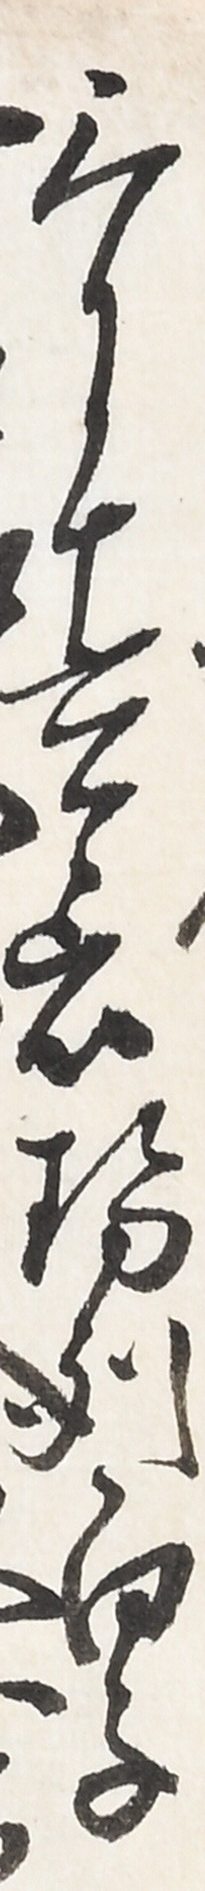三月十六日着勢州白子
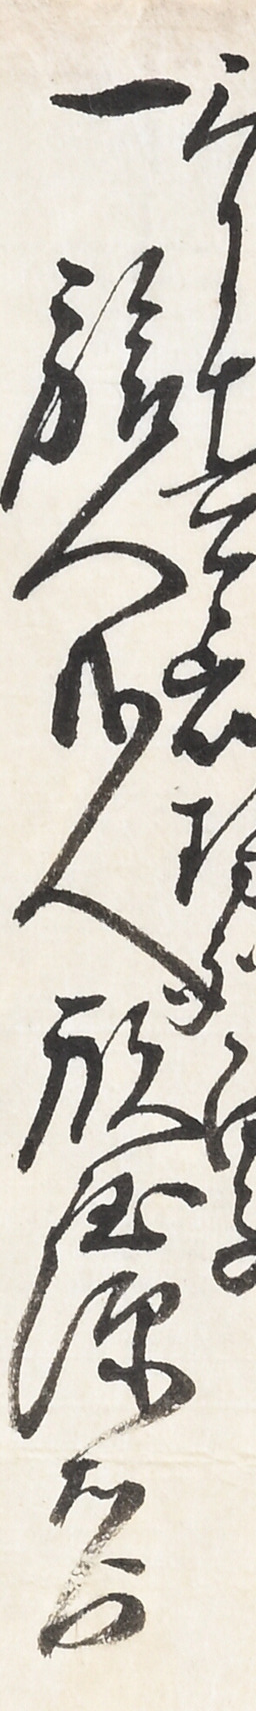一旅人弐人形屋源右衛門
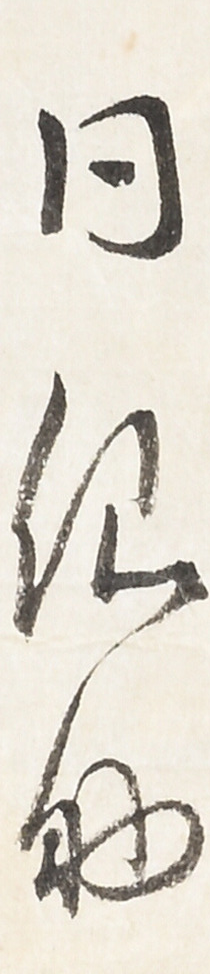同仙助
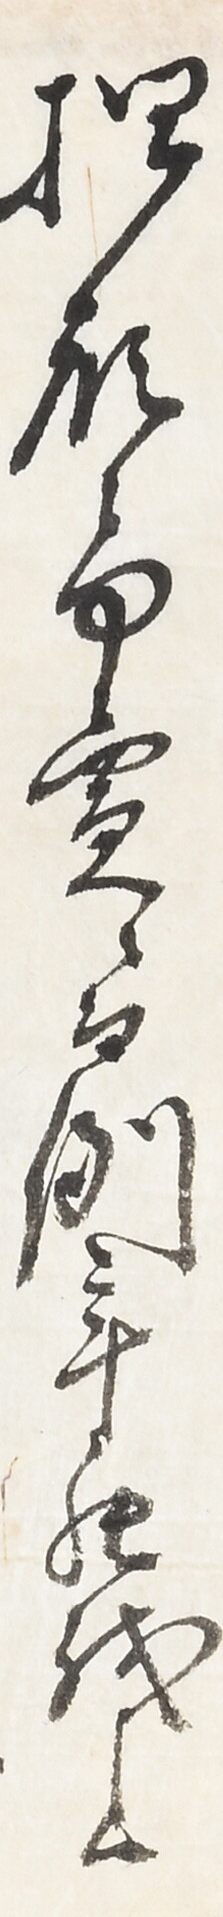押形商売ニ而例年罷越申候
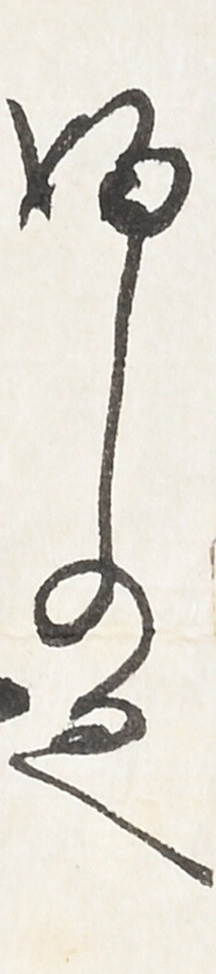ふしの屋
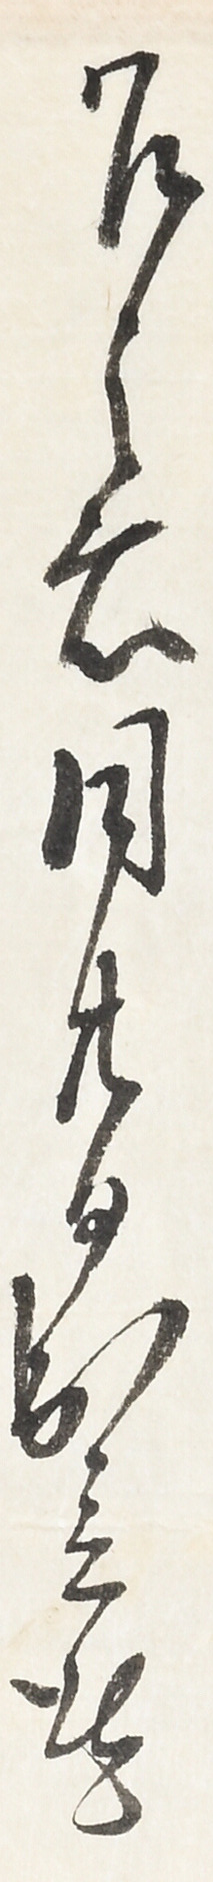右之者同廿日出立仕候
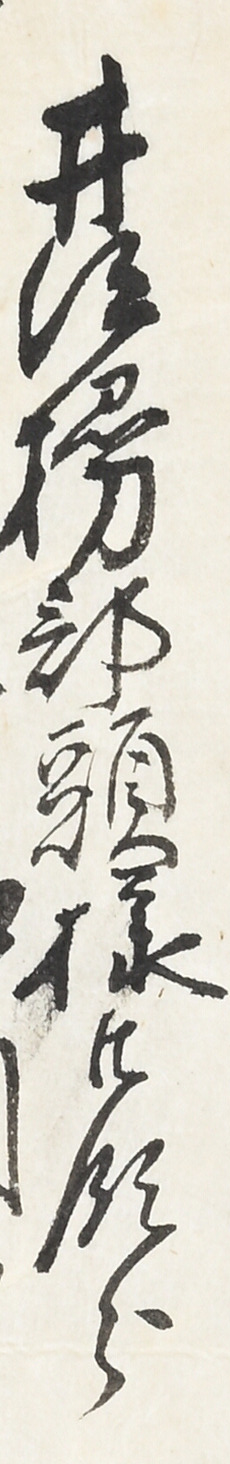井伊掃部頭様御領分
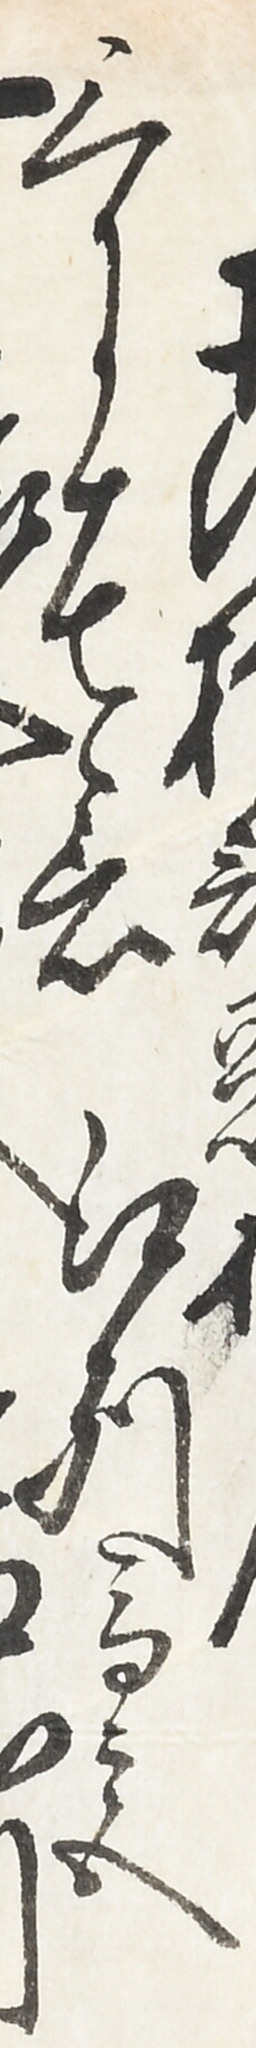参月十七日着江州高宮
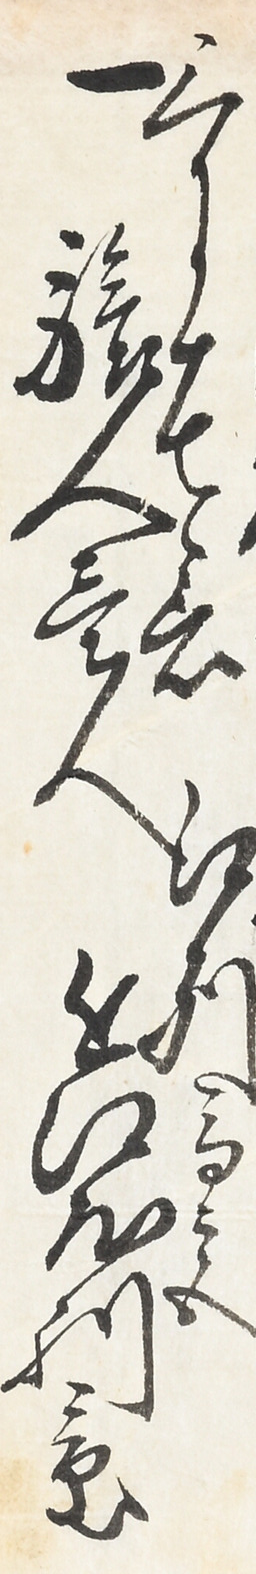一旅人壱人近江屋利景
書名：旅人泊控帳
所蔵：伊那市立高遠町図書館・合同会社AMANE
